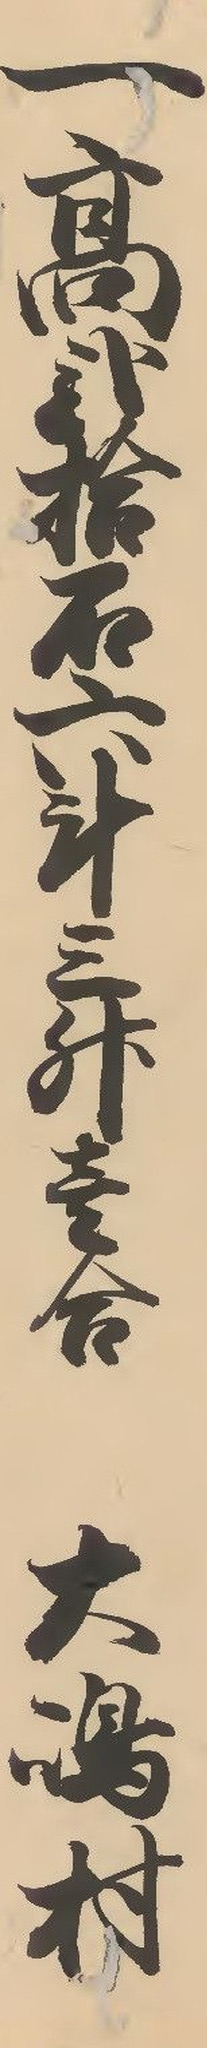一高弐拾石六斗三升壱合大島村
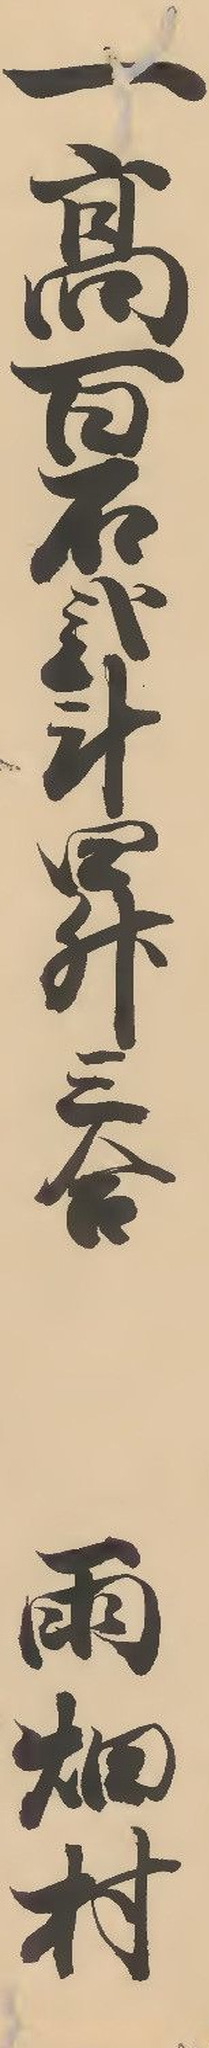一高百石弐斗四升三合雨畑村
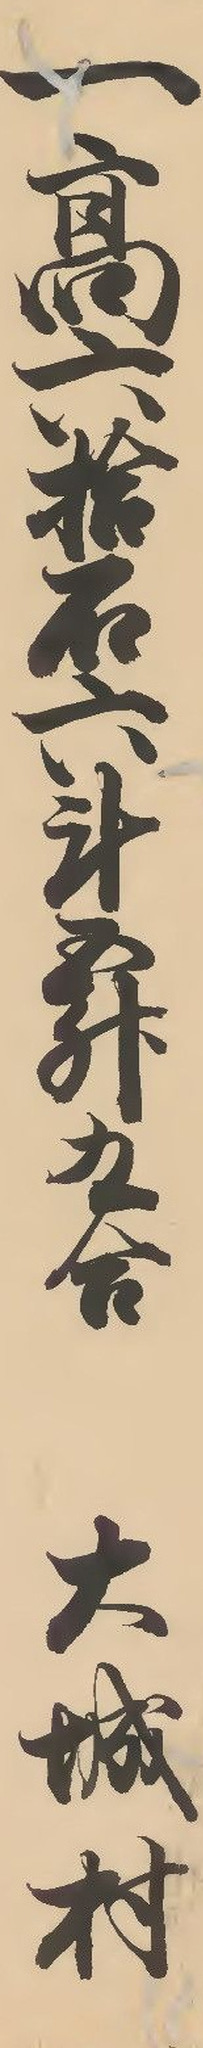一高六拾石六斗五升九合大城村
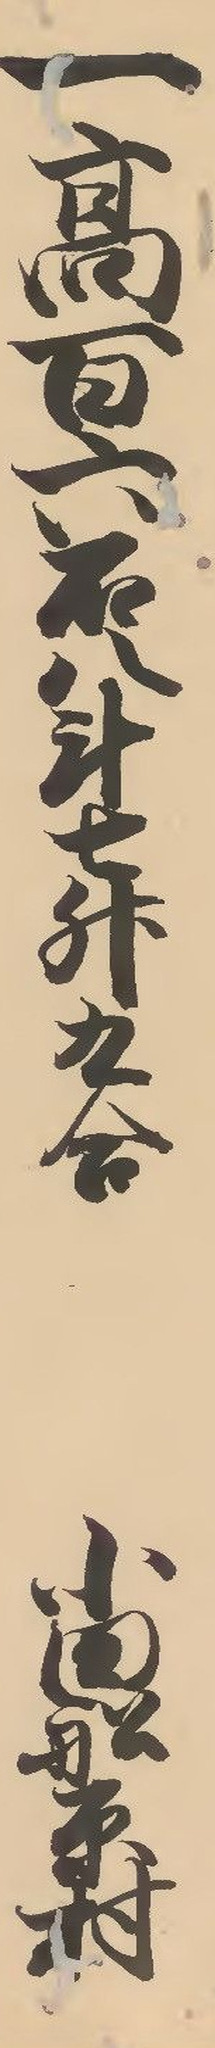一高百六石八斗七升九合小田船原村
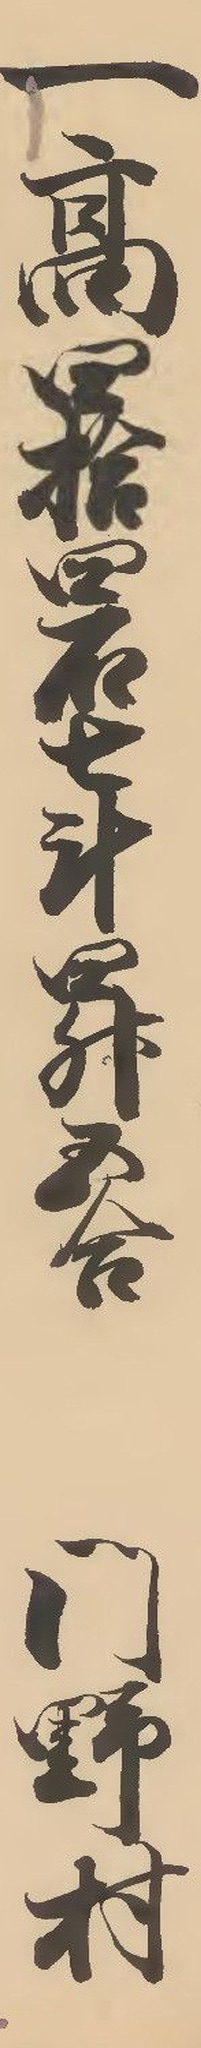一高四拾四石七斗四升五合門野村
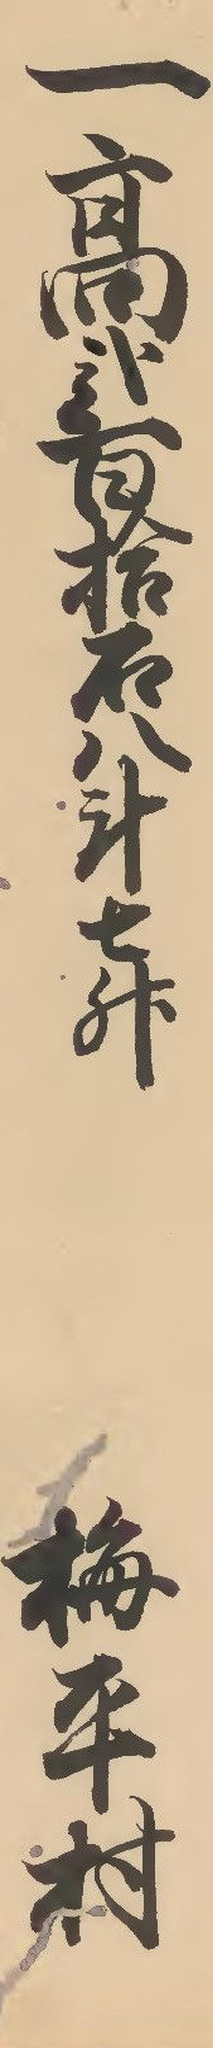一高弐百拾石八斗七升梅平村

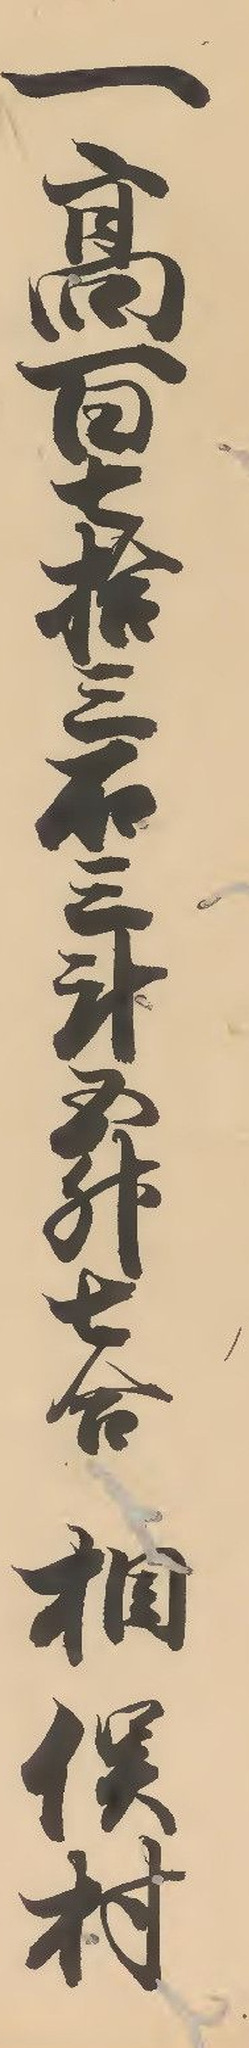一高百七拾三石三斗五升七合相俣村
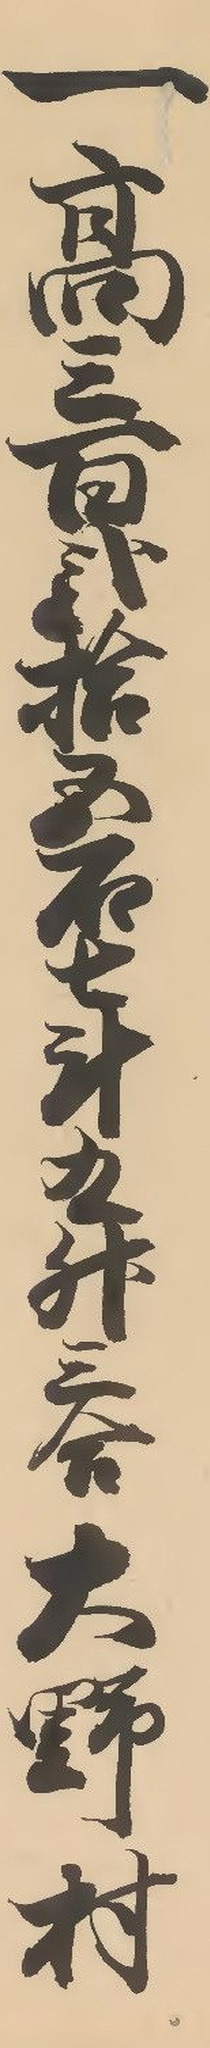一高三百弐拾五石七斗九升三合大野村
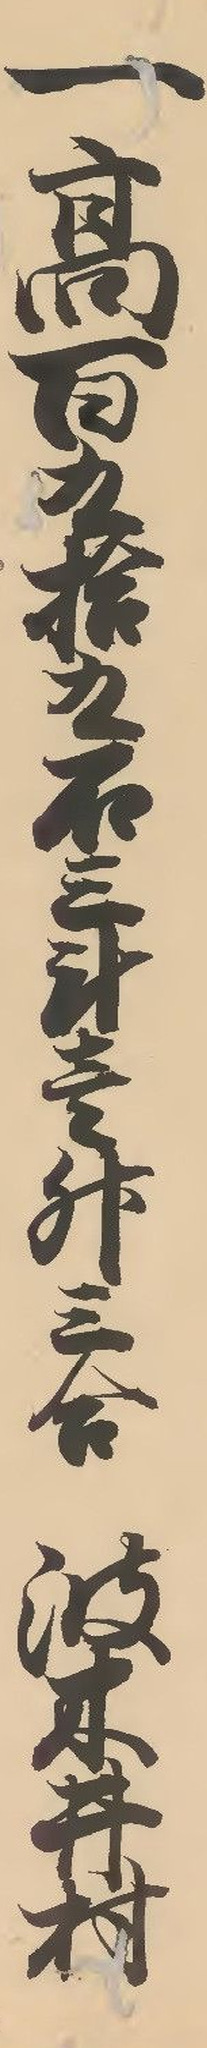一高百九拾九石三斗壱升三合波木井村
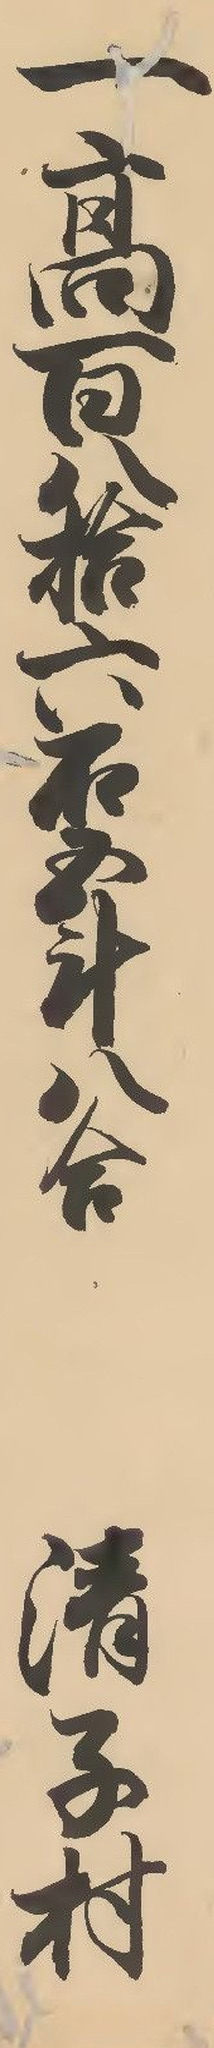一高百八拾六石五斗八合清子村
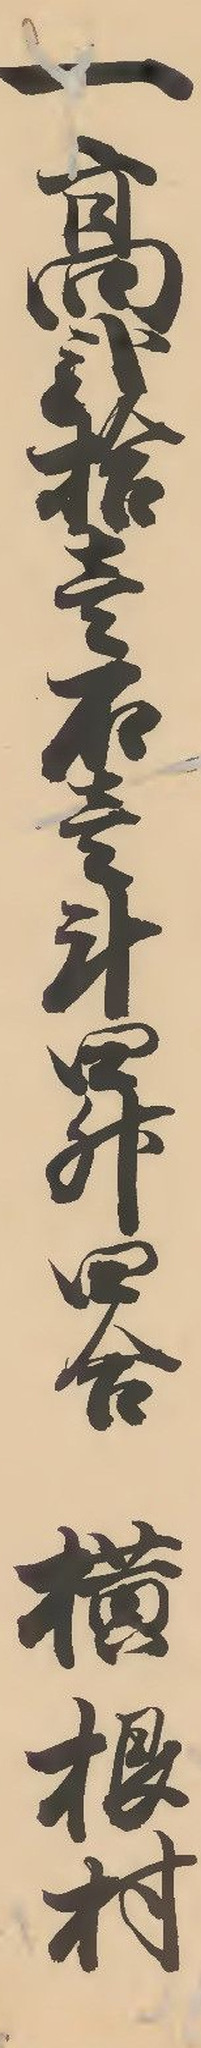一高弐拾壱石壱斗四升四合横根村
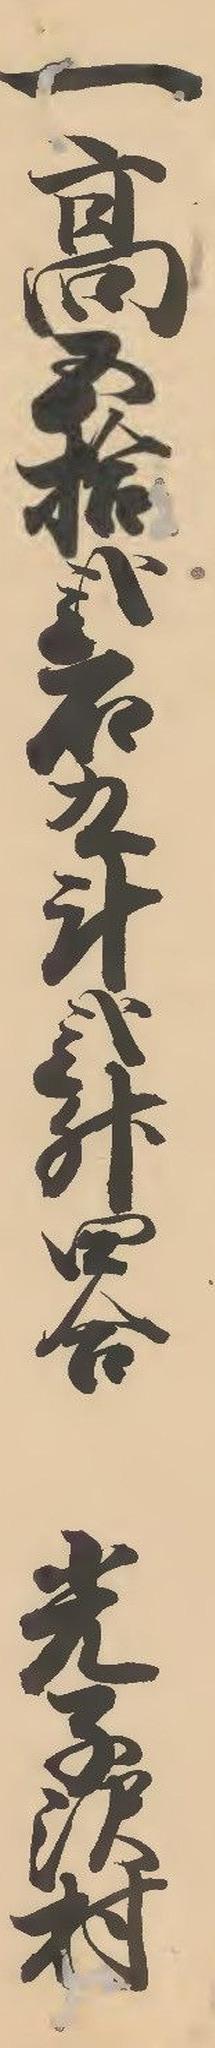一高五拾弐石九斗弐升四合光子沢村
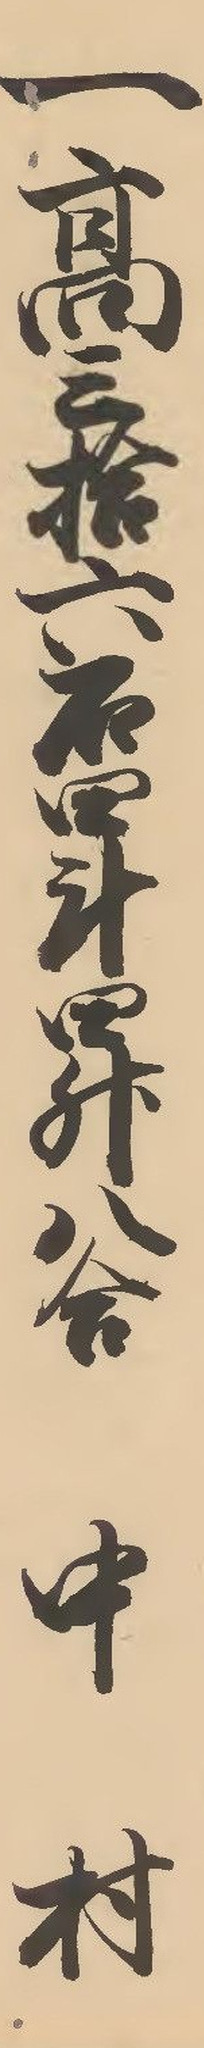一高三拾六石四斗四升八合中村
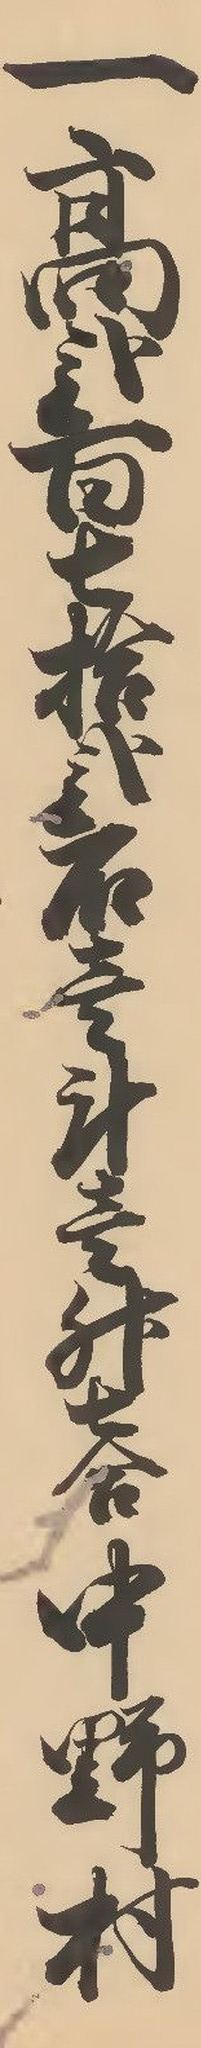一高弐百七拾弐石壱斗壱升七合中野村

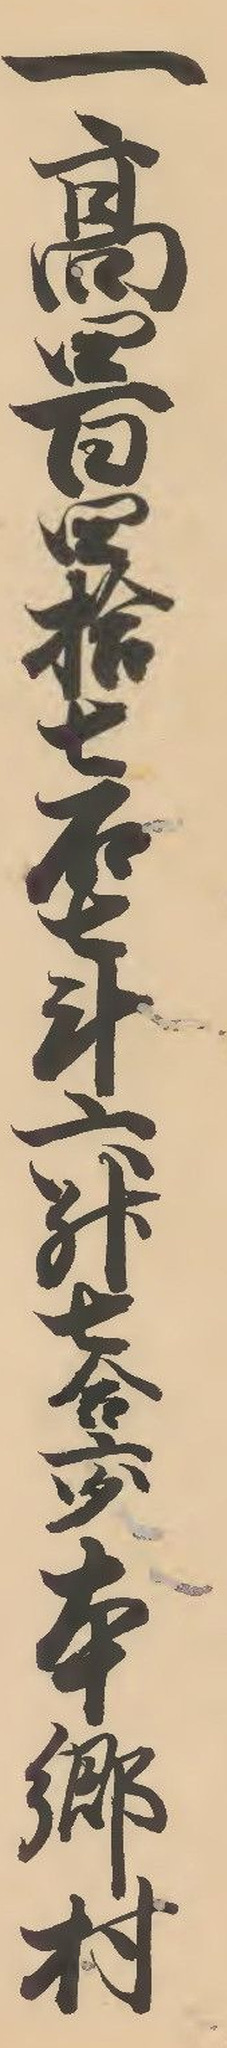一高四百四拾七石七斗六升七合六勺本郷村
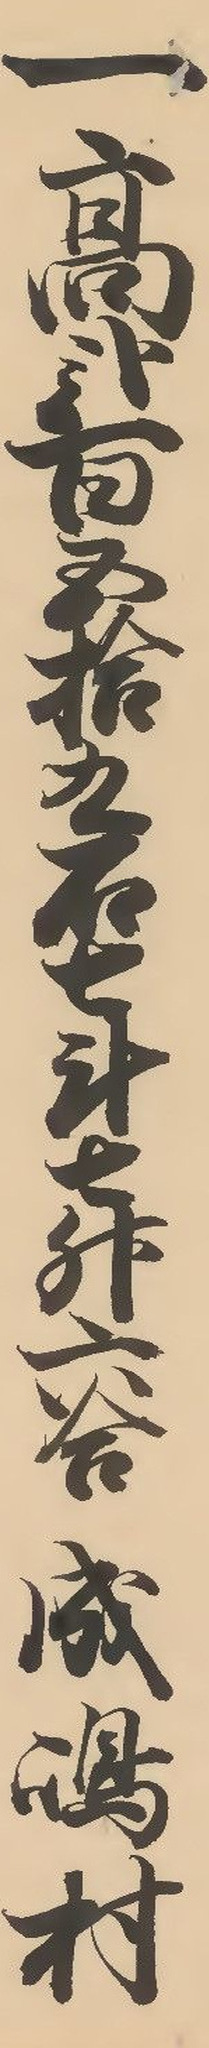一高弐百五拾九石七斗七升六合成島村
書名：甲斐国郷帳
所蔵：国立公文書館 National Archives of Japan
